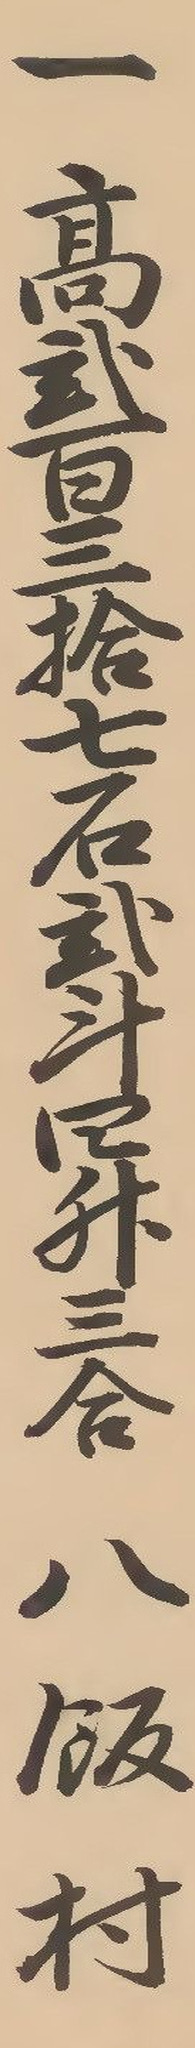一高弐百三拾七石弐斗四升三合八飯村
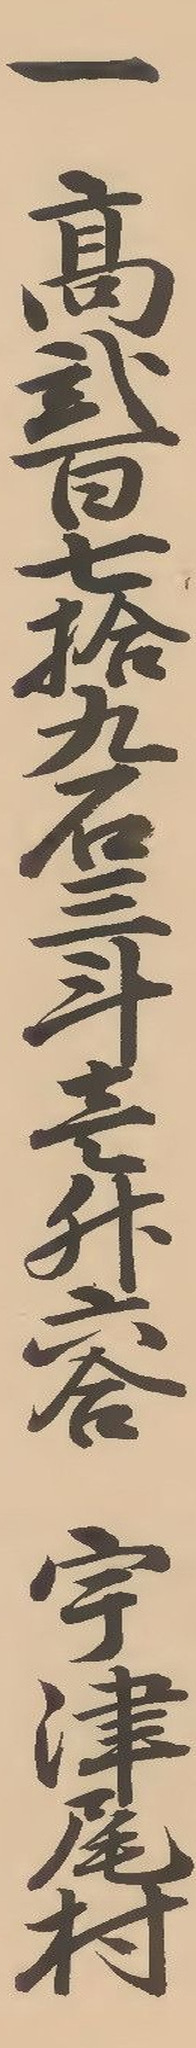一高弐百七拾九石三斗壱升六合宇津尾村
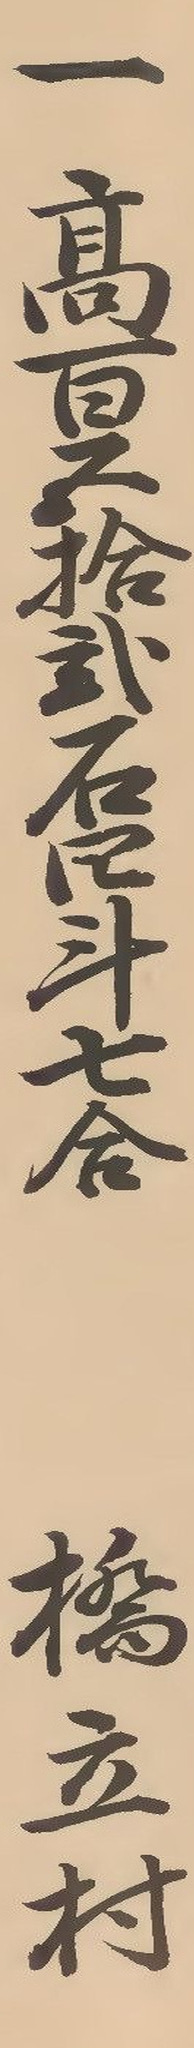一高百五拾弐石四斗七合橋立村
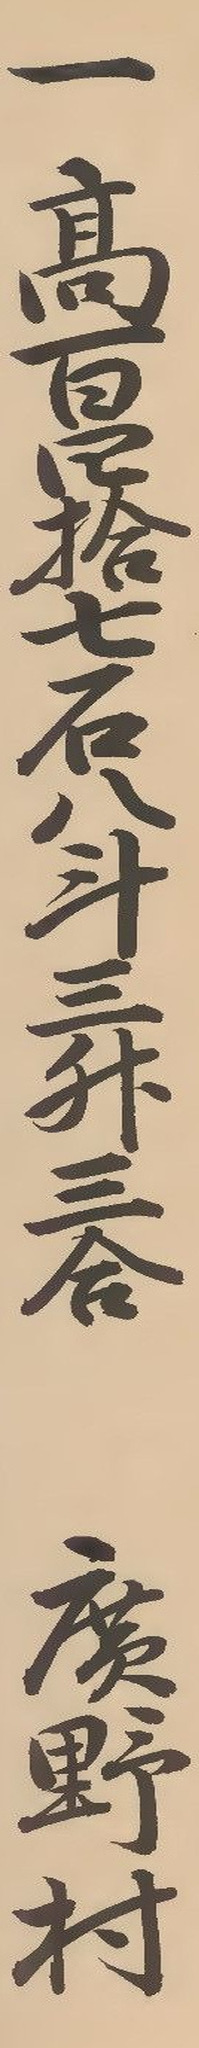一高百四拾七石八斗三升三合広野村
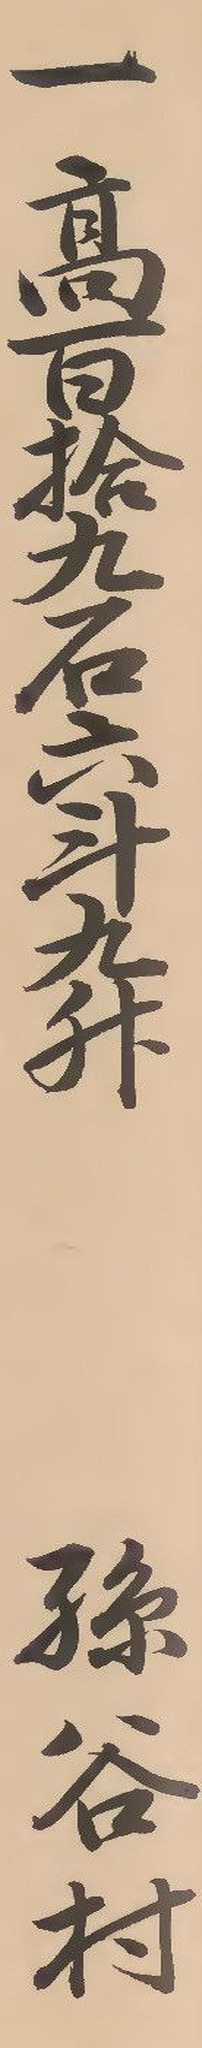一高百拾九石六斗九升孫谷村
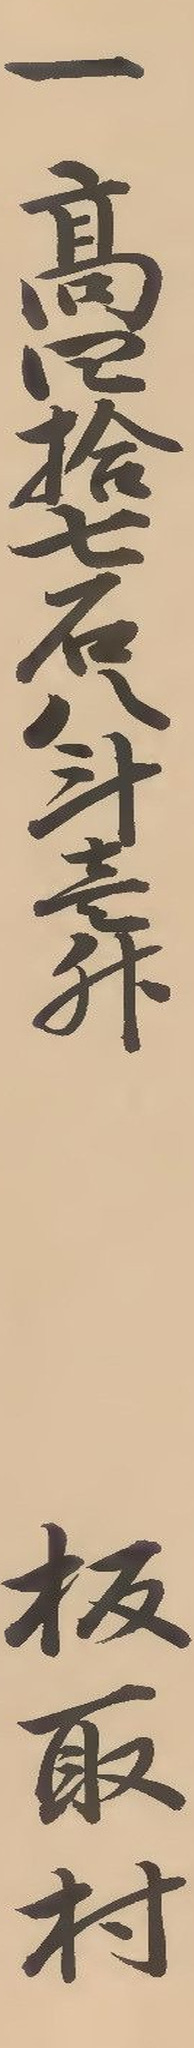一高四拾七石八斗壱升板取村
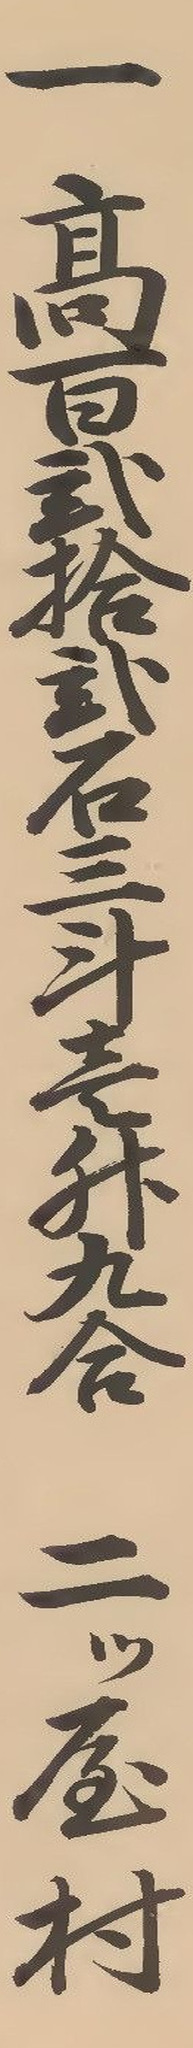一高百弐拾弐石三斗壱升九合二ツ屋村
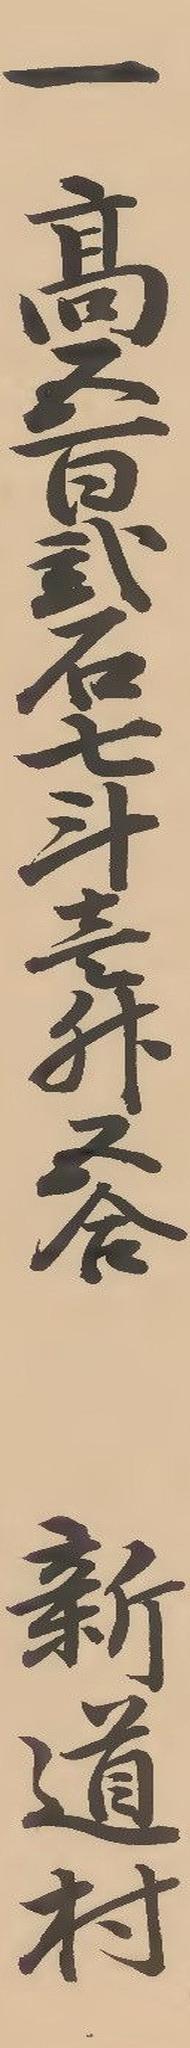一高五百弐石七斗壱升五合新道村

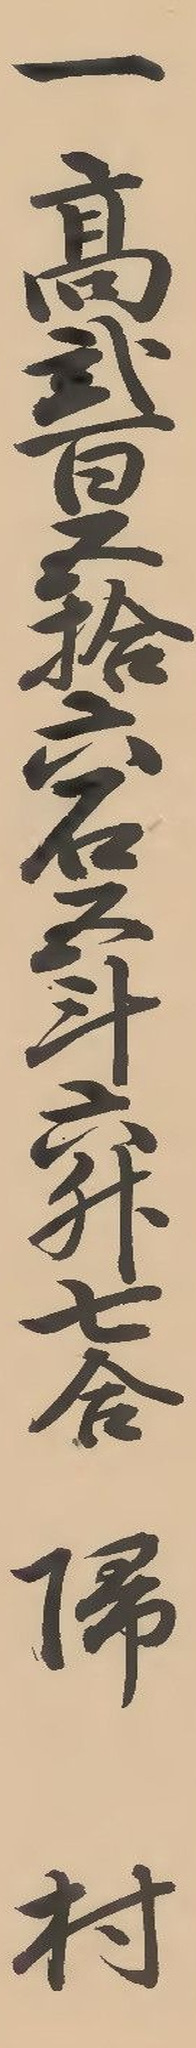一高弐百五拾六石五斗六升七合帰村
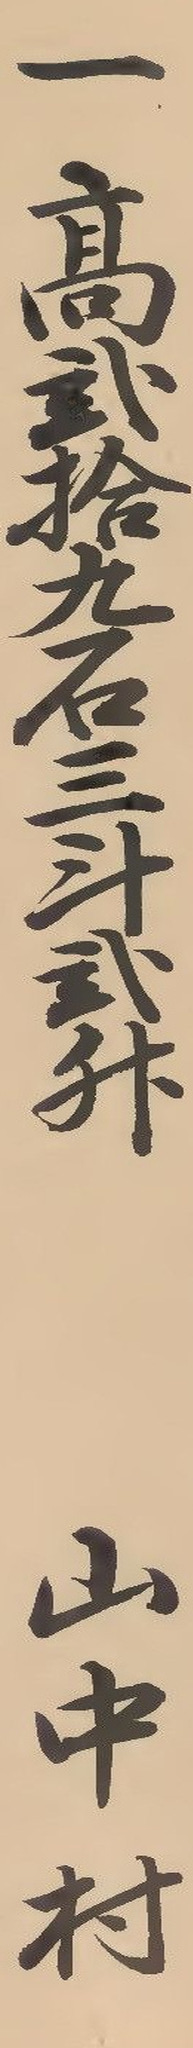一高弐拾九石三斗弐升山中村
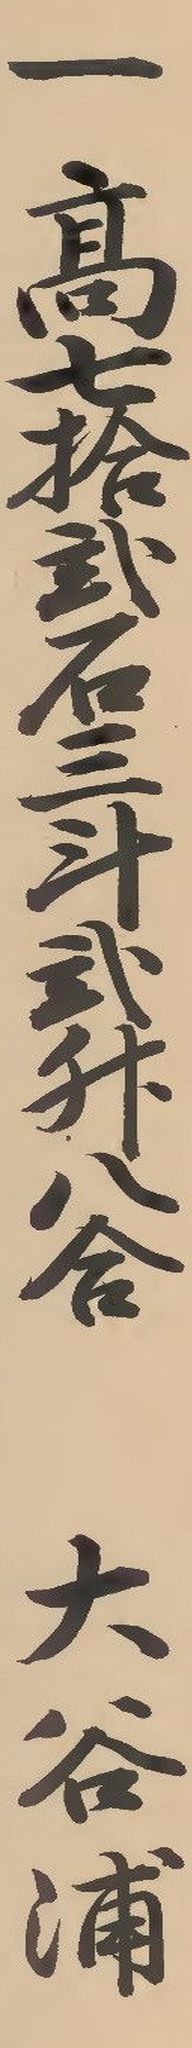一高七拾弐石三斗弐升八合大谷浦
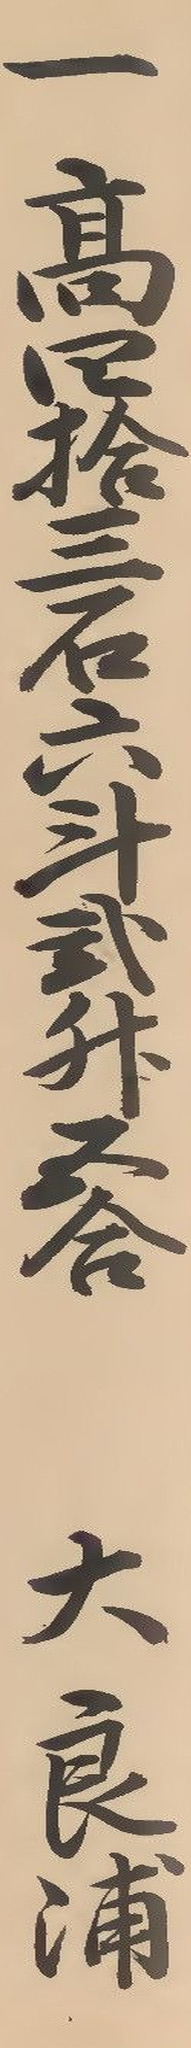一高四拾三石六斗弐升五合大良浦
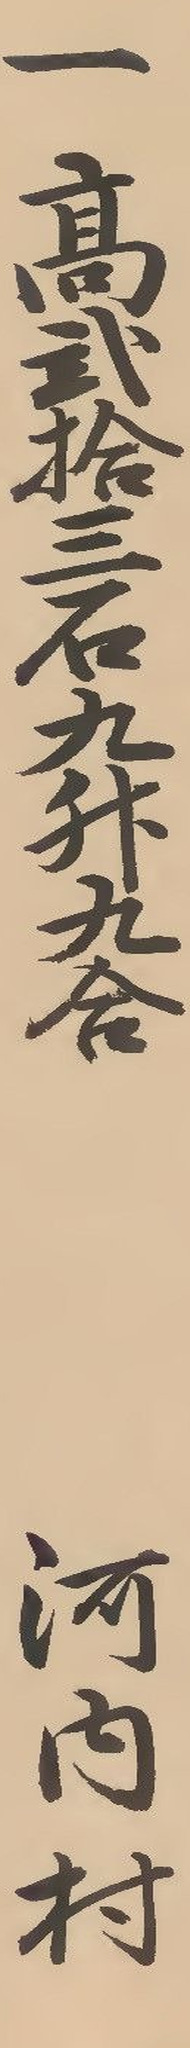一高弐拾三石九升九合河内村
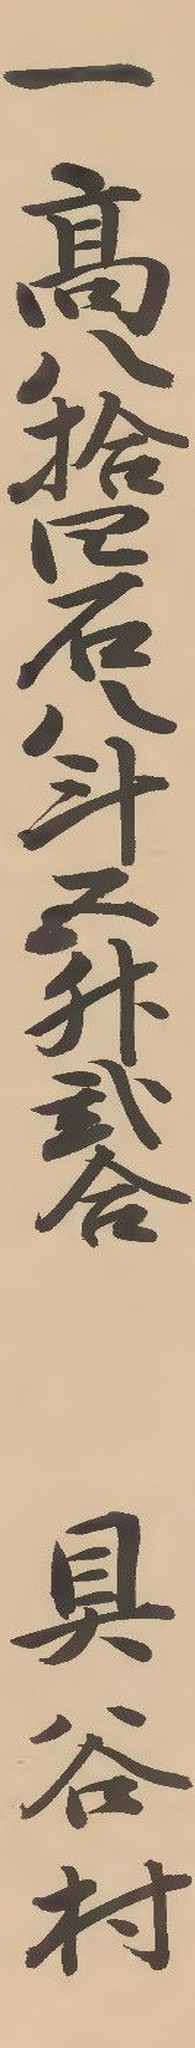一高八拾四石八斗五升弐合具谷村
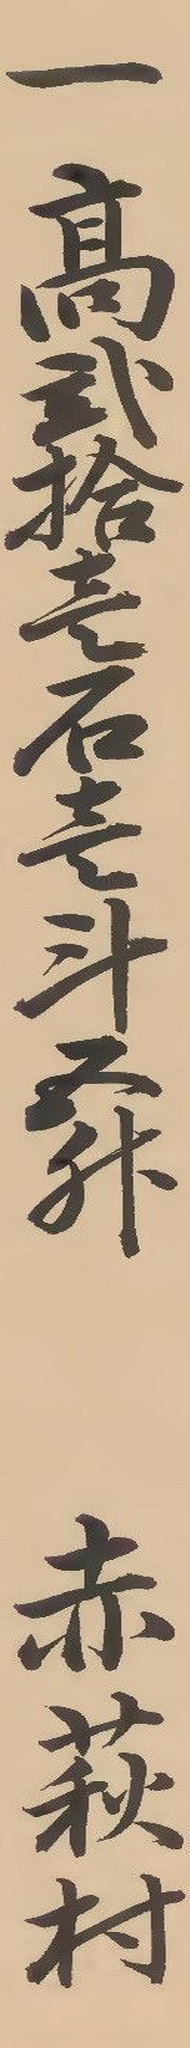一高弐拾壱石壱斗五升赤萩村

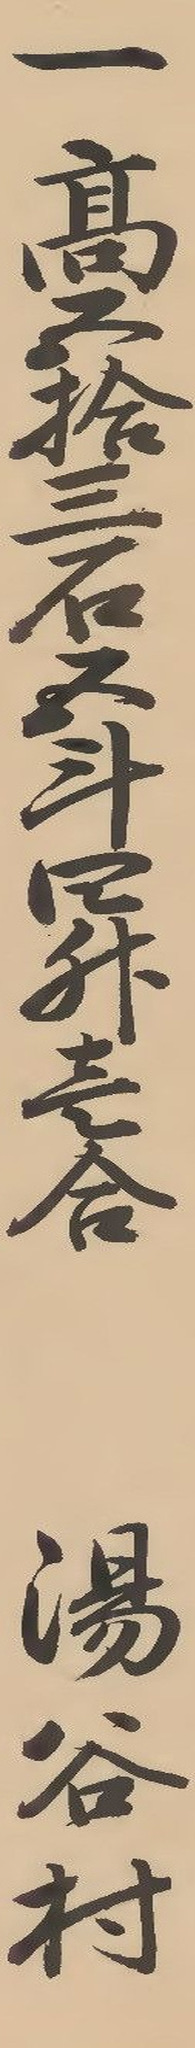一高五拾三石五斗四升壱合湯谷村
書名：越前国郷帳
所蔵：国立公文書館 National Archives of Japan
